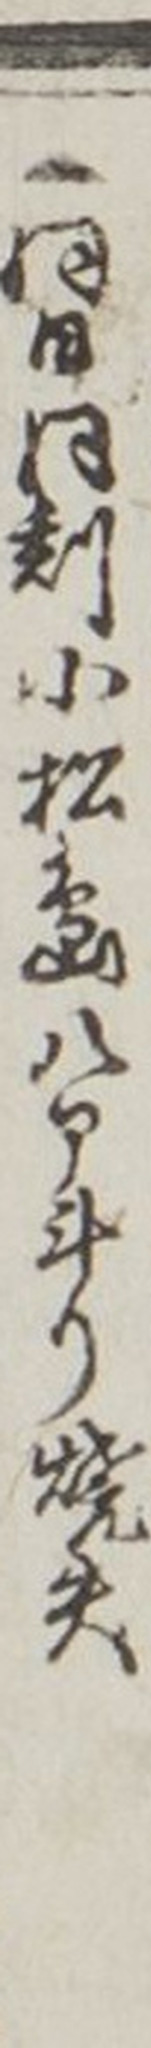▲同日同刻小松島八部計り焼失
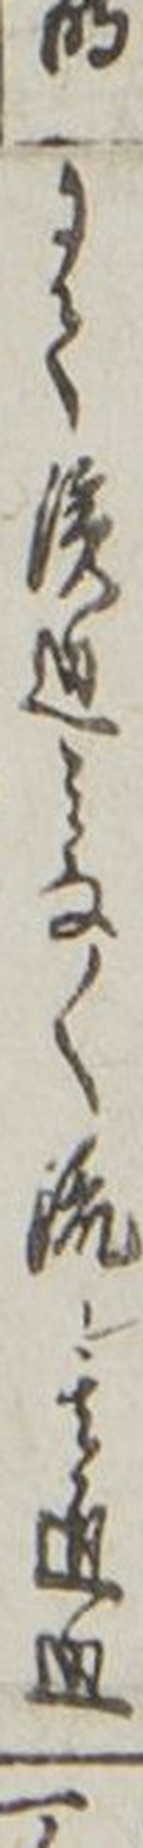にて浜辺みな〳〵流れ其近辺
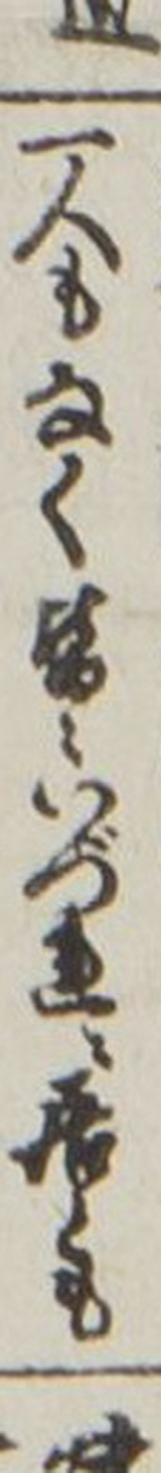一人もなく皆々いづれに居とも
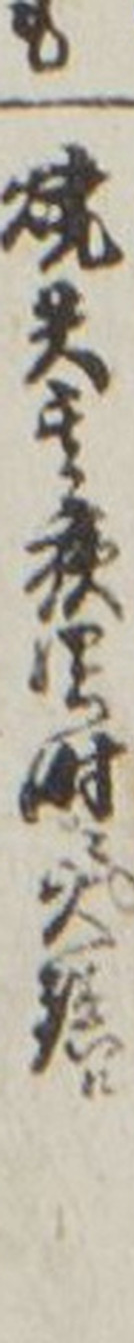焼失其夜四つ時に火鎮る
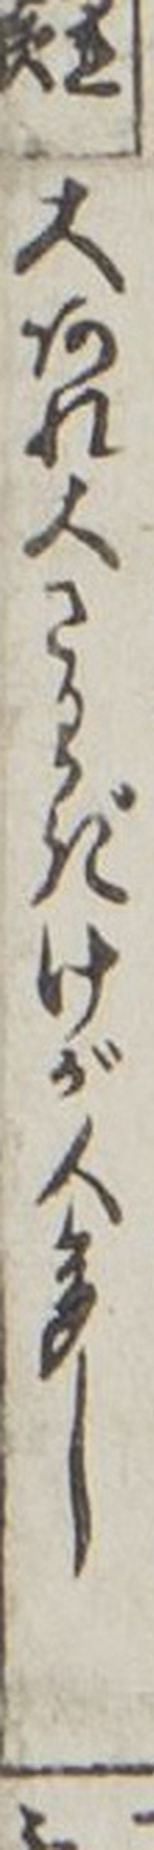大あれ大さわぎけが人多し
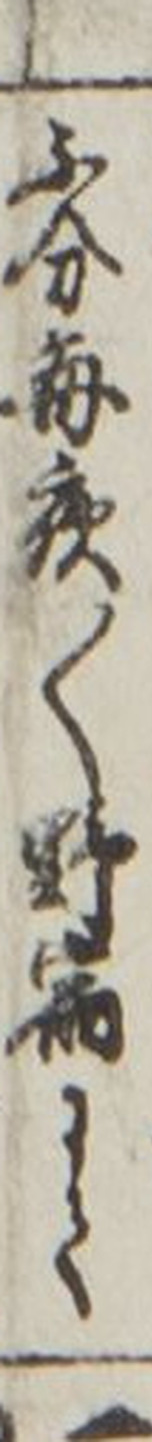不分毎夜〳〵野宿にて
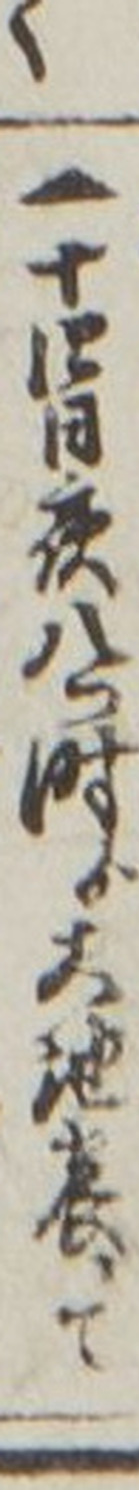▲十四日夜八つ時より大地震にて
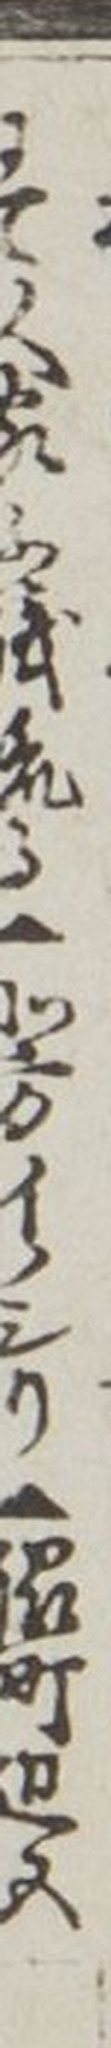にて人家不残流る▲北方イノシリ▲脇町辺五
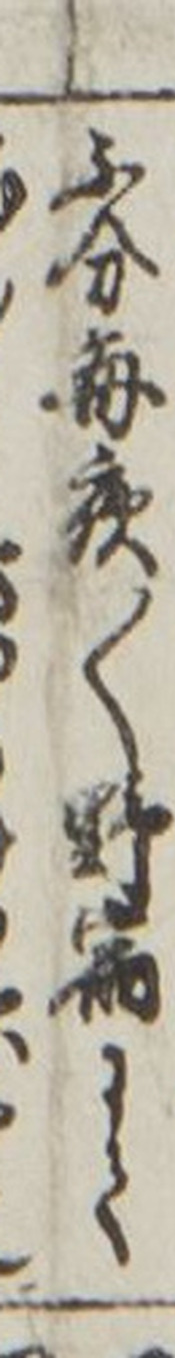不分毎夜〳〵野宿にて
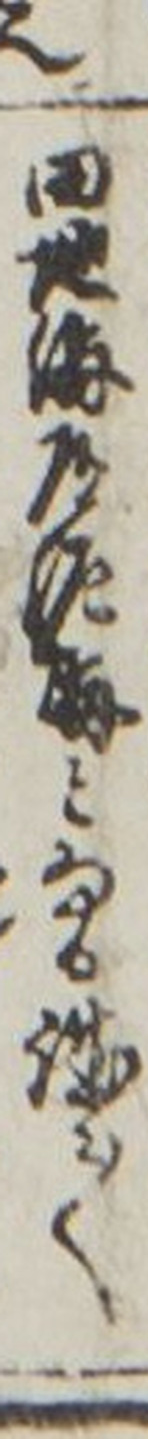田地海道泥海となる誠に〳〵
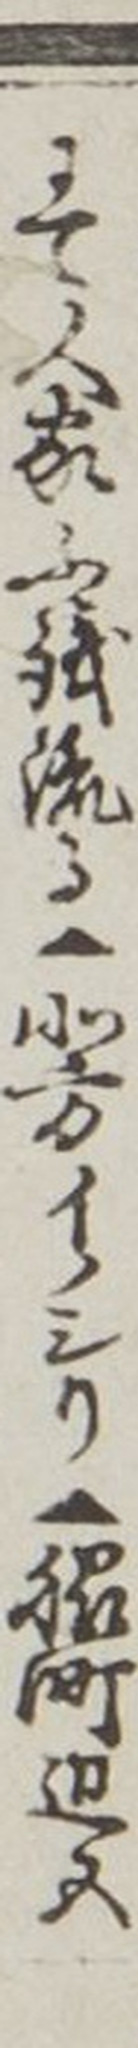にて人家不残流る▲北方イノシリ▲脇町辺五
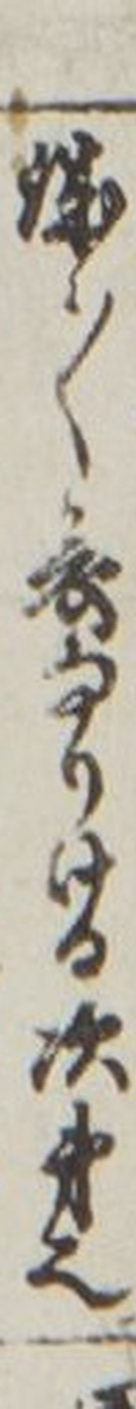誠に〳〵哀なりける次第也
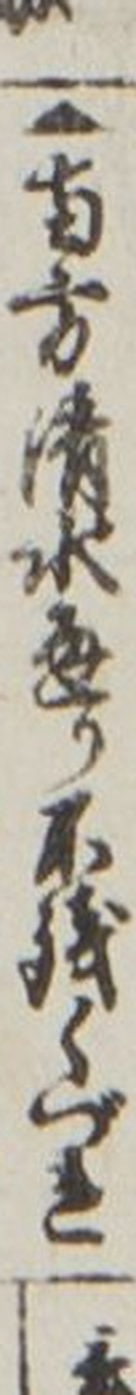▲南方清水通り不残くづれ
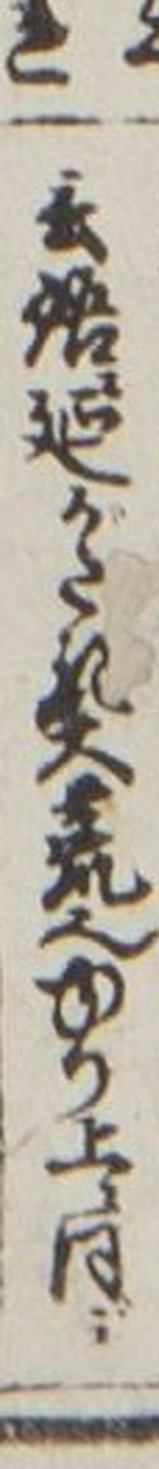言語に延がたき大荒也ゆり上に同じ
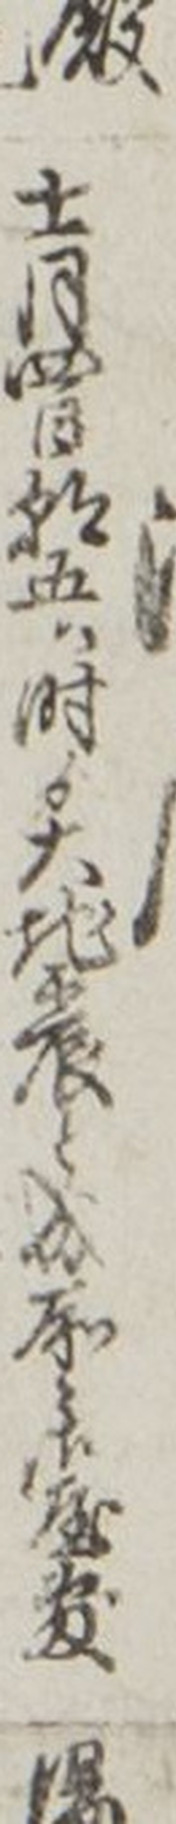十一月四日朝五つ時より大地震と成所々御屋敷
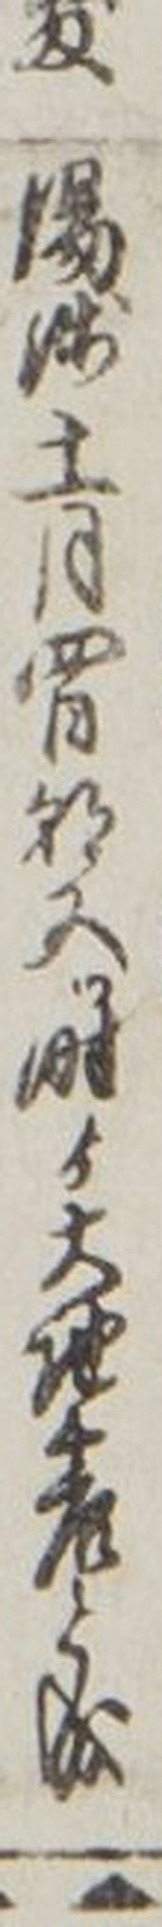湯浅十一月四日朝五つ時より大地震と成
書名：嘉永七年寅十一月諸国大地震大津波并出火
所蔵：あいおいニッセイ同和損保株式会社
